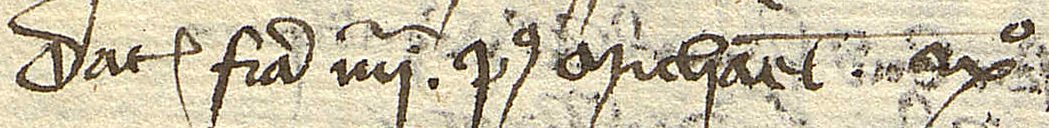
Dat* fia* iiii* . p* Michael* . ix*
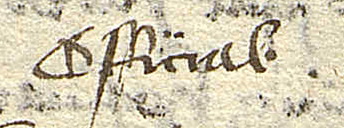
Official
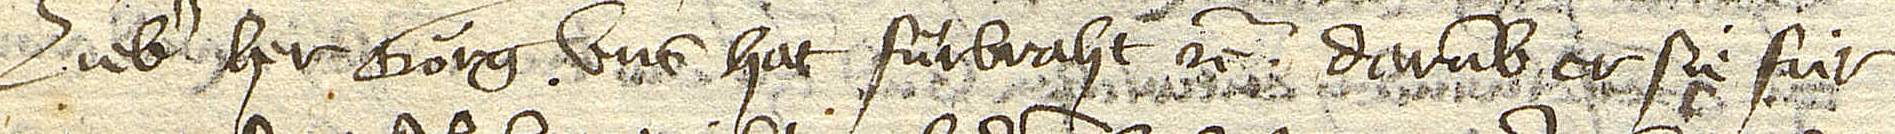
Lieb* her Görg . vns hat fürbraht ec* . daru*b er ſie für
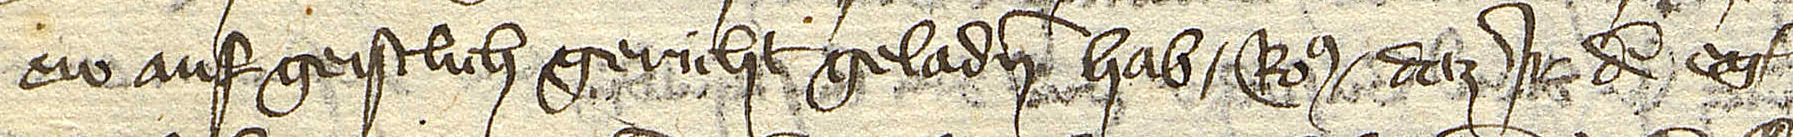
ew auf geiſtlich gericht geladn* hab / Ro* / daʒ Ir d* eg*
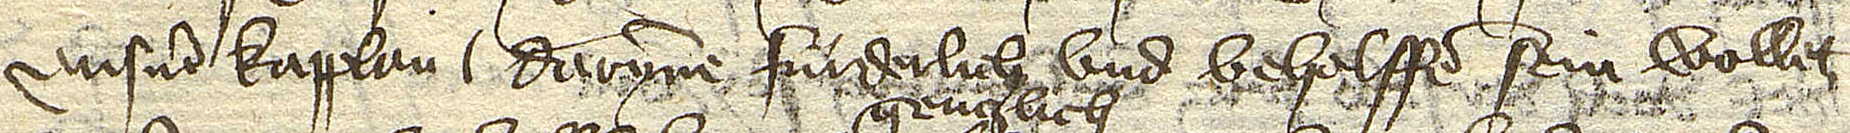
vnſm* kapplan / daryne* fürderlich vnd beholffe* ſein wollet
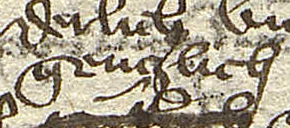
gencʒlich
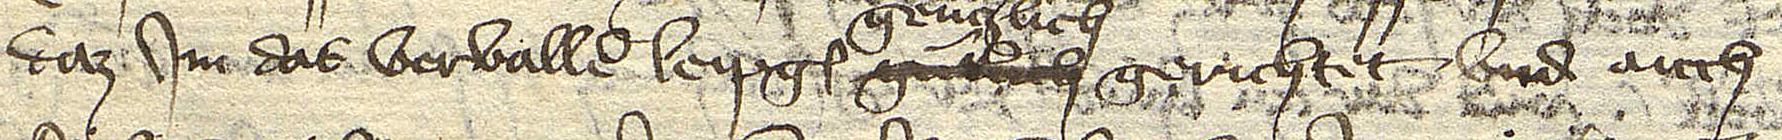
daʒ Im das vervalle* lei%%g* gütlich gerichtet vnd auch
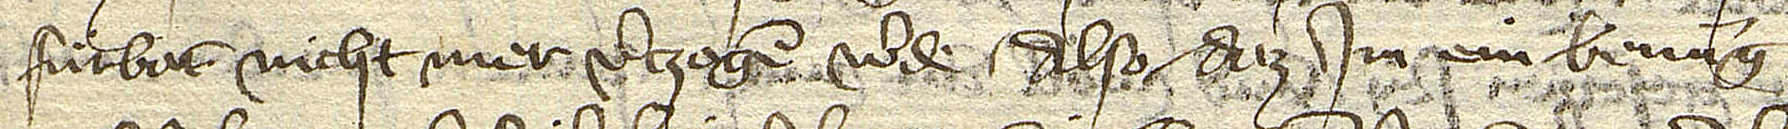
fürbas nicht mir v*cʒoge* w*de / Alſo / daʒ Im ein benüg
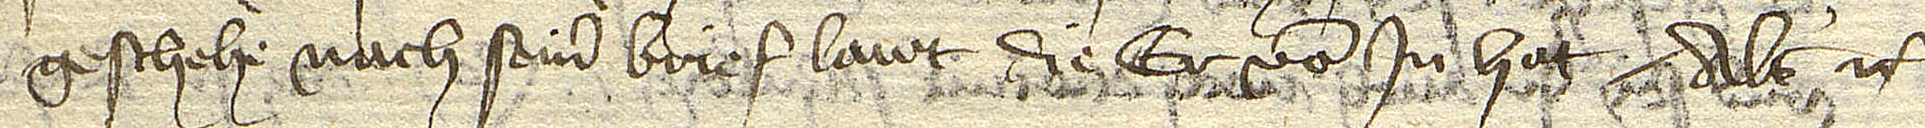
geſchehe nach ſein* brief lawt die Er vo* In hat / Als ec*
